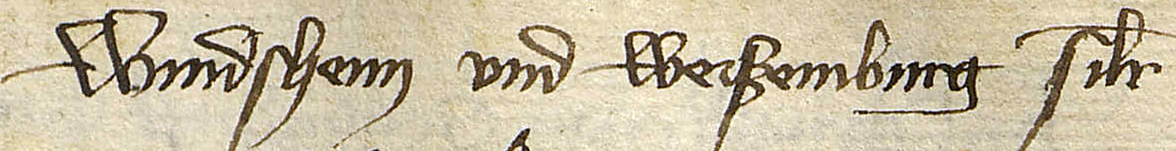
Windſheim vnd Weiſʒemburg ſilr*
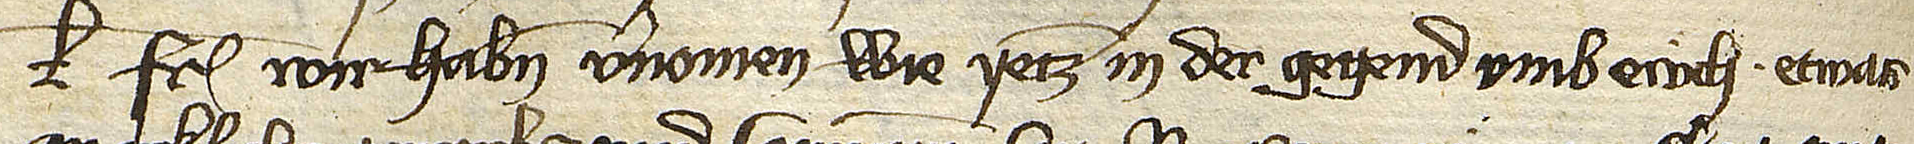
L* fr* wir habn* v*nomen wie yecʒ* in der gegend vmb eẅch . etwas
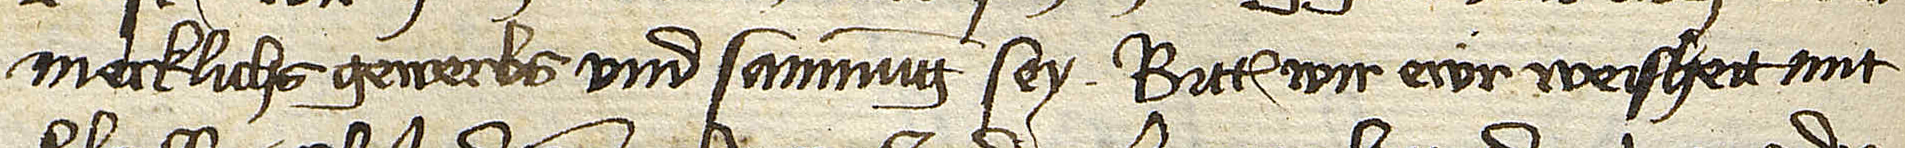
merklichs gewerbs vnd ſamnu*g ſey . Bitt* wir eẅr weiſheit mit
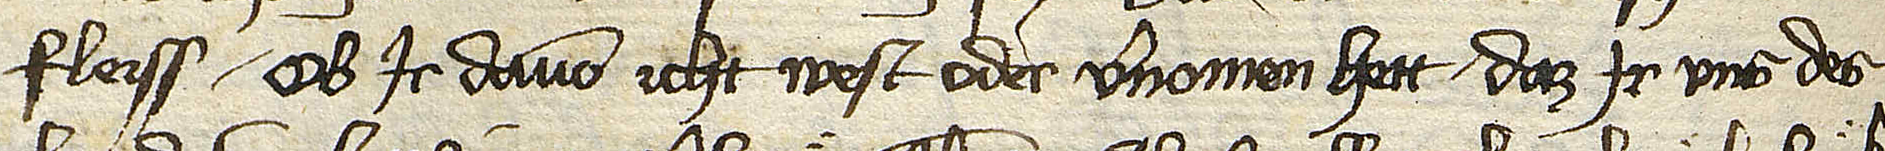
fleiſſ / Ob Ir dauo* icht weſt oder v*nomen hett / daʒ Ir vns des
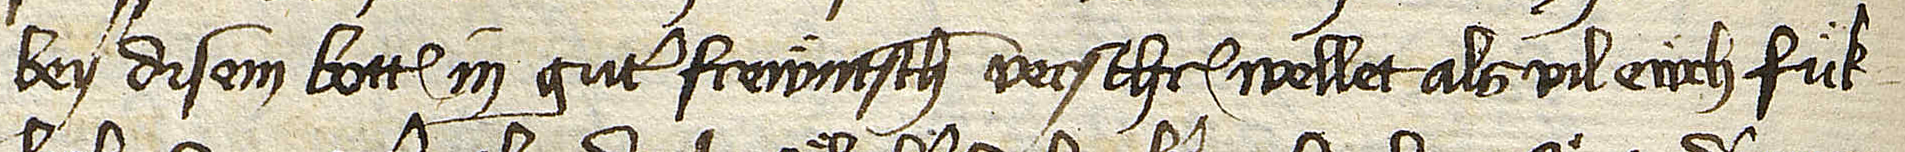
bey diſem bott* in gut* freẅntſch* verſchr* wellet als vil eẅch fük =
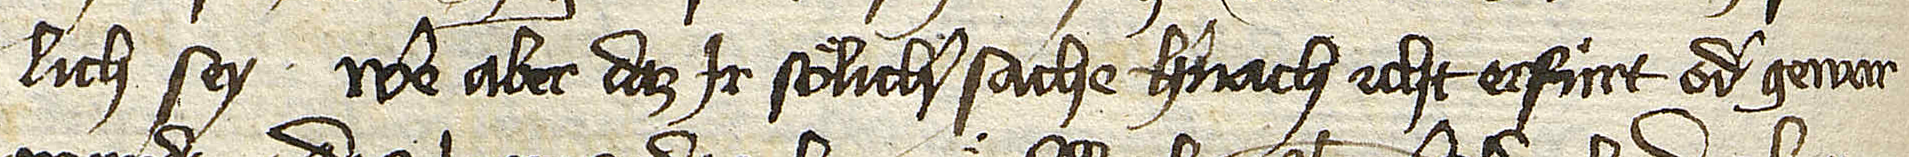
lich ſey . w*e aber daʒ Ir ſölich* ſache h*nach icht erfürt od* gewar
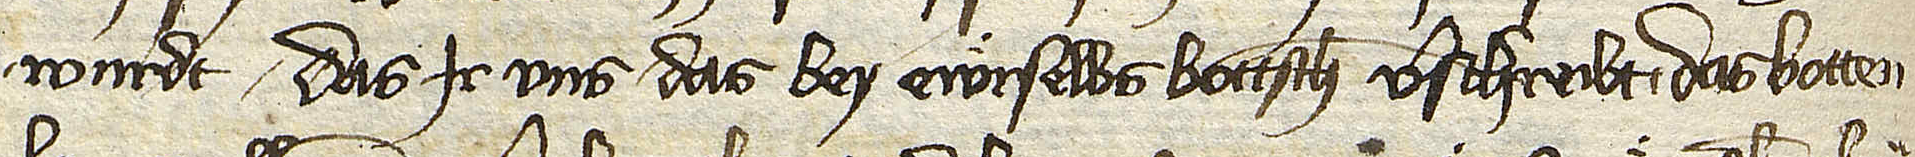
wurdt / Das Ir vns / das bey eẅrſelbs bottſch* v*ſchreibt / Das botten
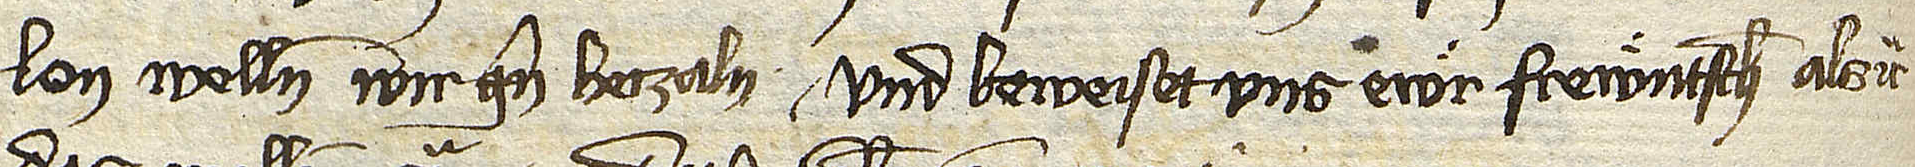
lon welln* wir g*n becʒaln / vnd beweiſet vns eẅr freẅntſch* als ec*
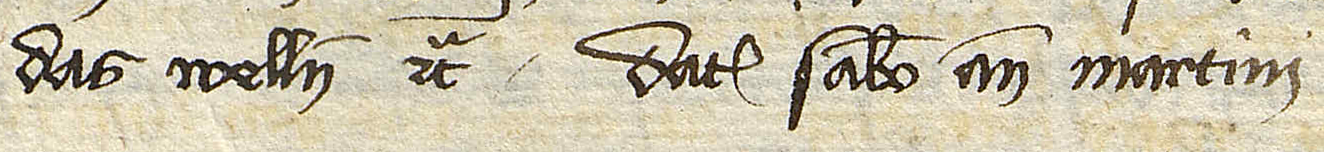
das welln* ec* / Dat* ſabo* an* martini
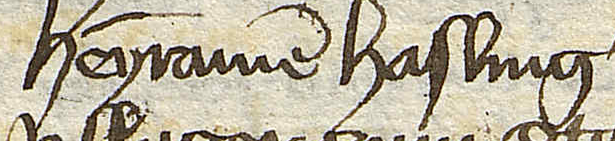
Hey*rame* Haſling*
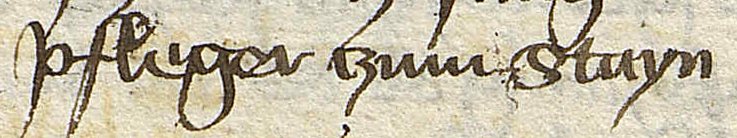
pfleger cʒum Stayn
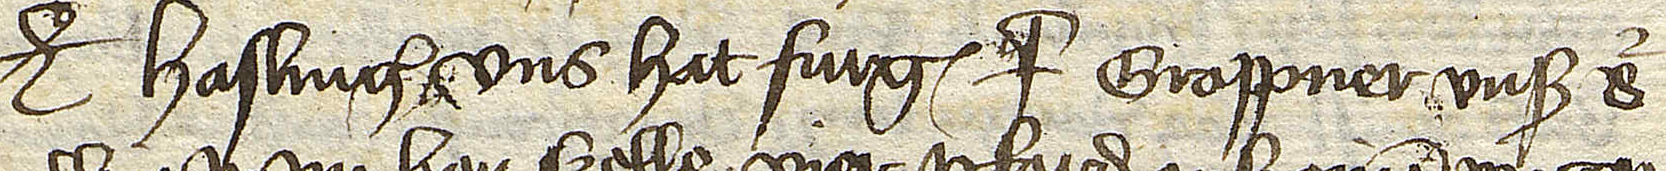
L* Halſling* vns hat fürg* F Groppner vnſ* B*
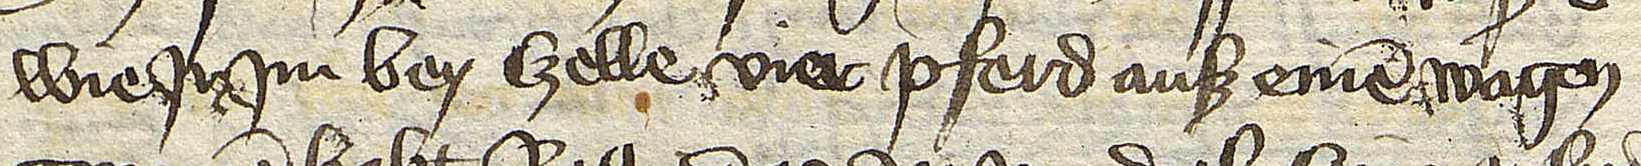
wie Ir Im bey Cʒelle vier pferd auſʒ eine* wagen
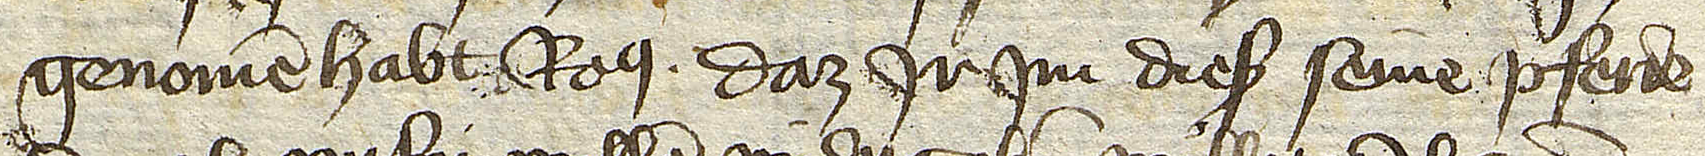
genome* habt Ro* . daʒ Ir Im dieſ* ſeine pferde
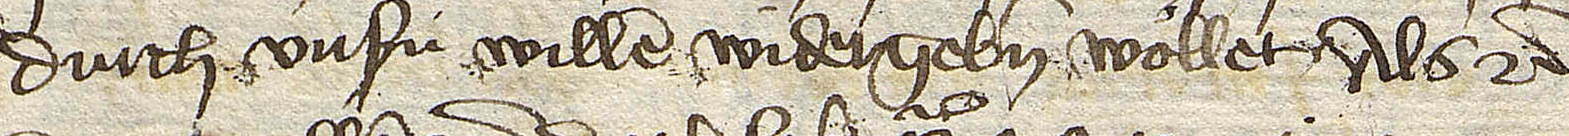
durch vnſ*n wille* widergebn* wöllet Als ec*
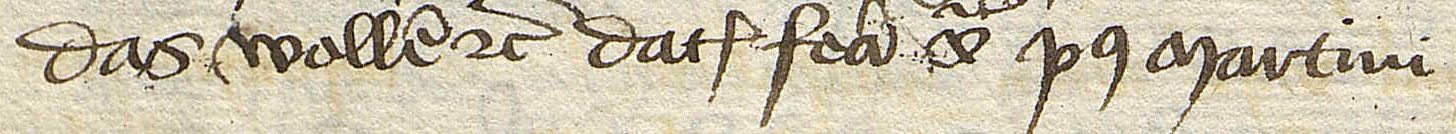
das wolle* ec* dat* fea* v* p* Martini
